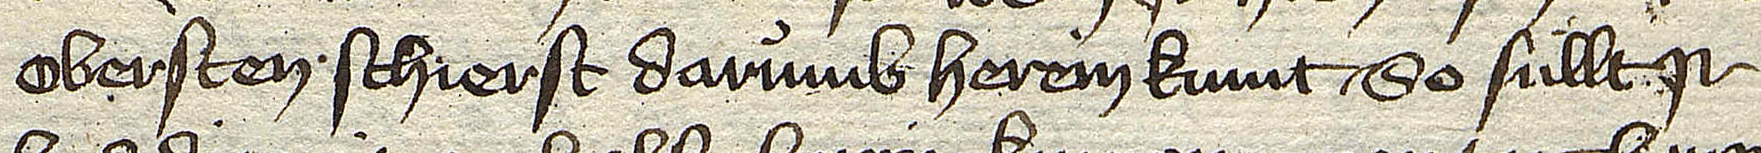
Oberſten ſchierſt darümb herein kumt / So ſüllt Ir
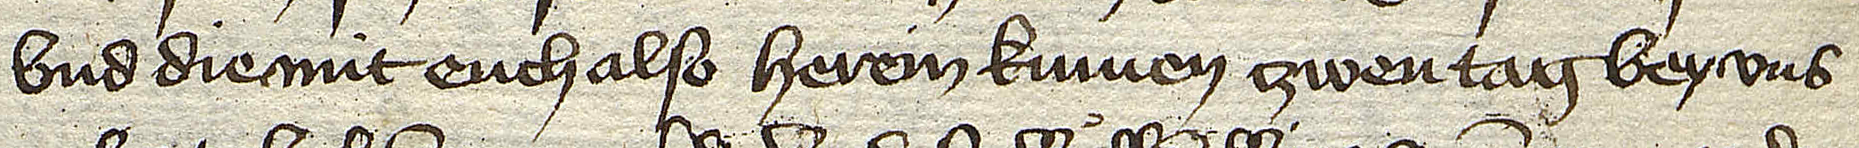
vnd die mit euch alſo herein kumen cʒwen tag bey vns
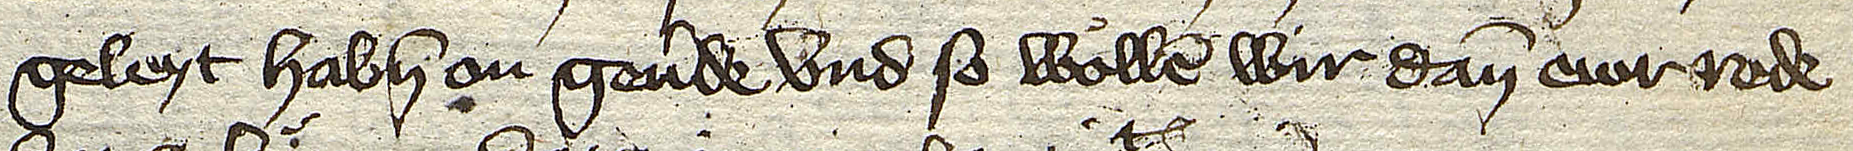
geleyt habn* on geu*de Vnd ſo wölle* wir dan* ewr rede
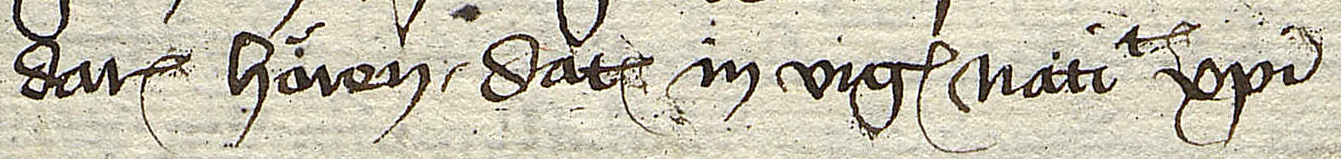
dar* hören / Dat* in vig* nati* xpi*
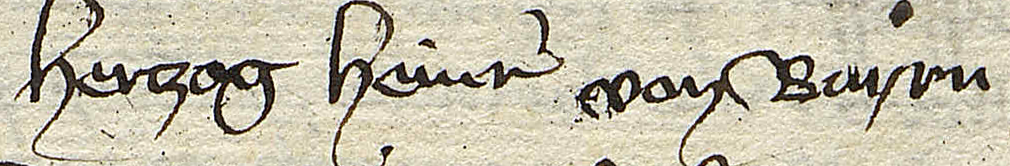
hercʒog heinr* von Bayrn
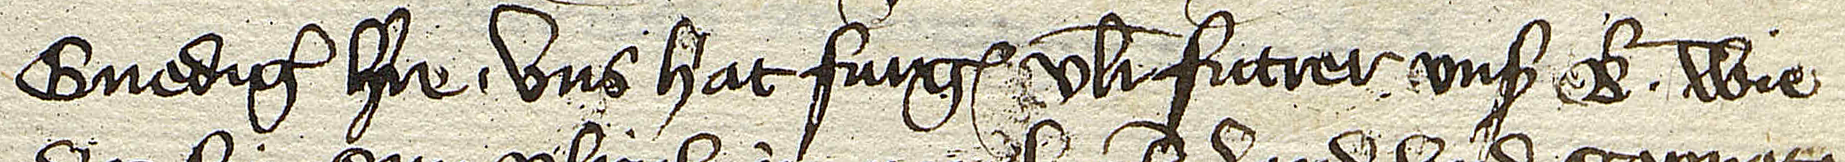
Gnedig* h*re / Vns hat fürg* vlr* futrer vnſ* B* . wie
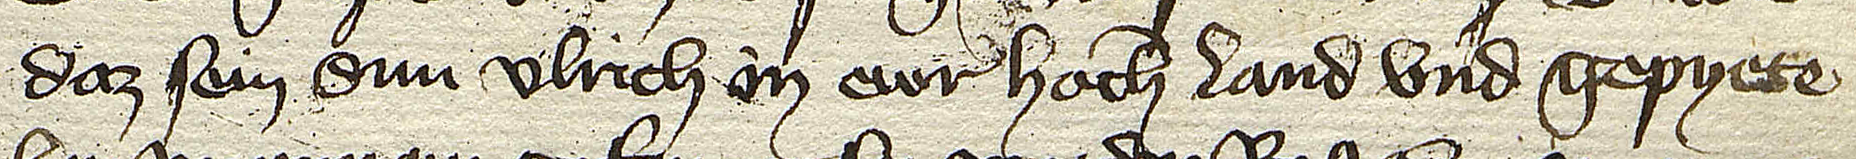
daʒ ſein Sun vlrich in ewr* hoch* land vnd gepyete
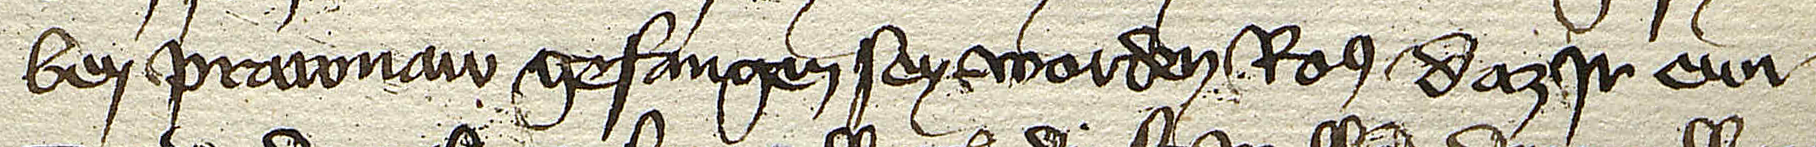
bey prawnaw gefangen ſey worden Ro* / daʒ Ir ewr
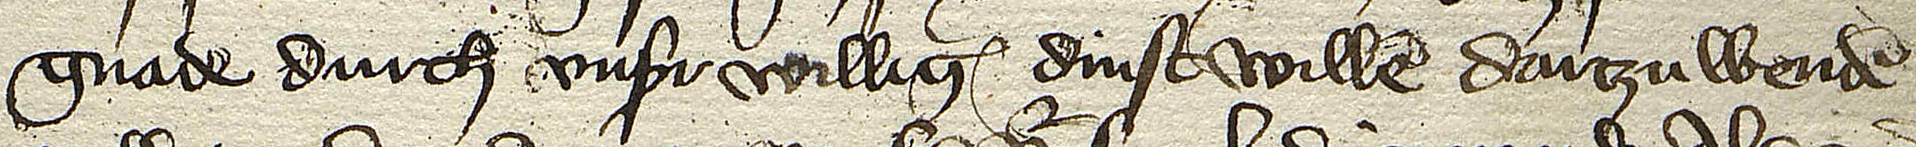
gnade durch vnſ*r willig* dinſt wille* darcʒu wunde*
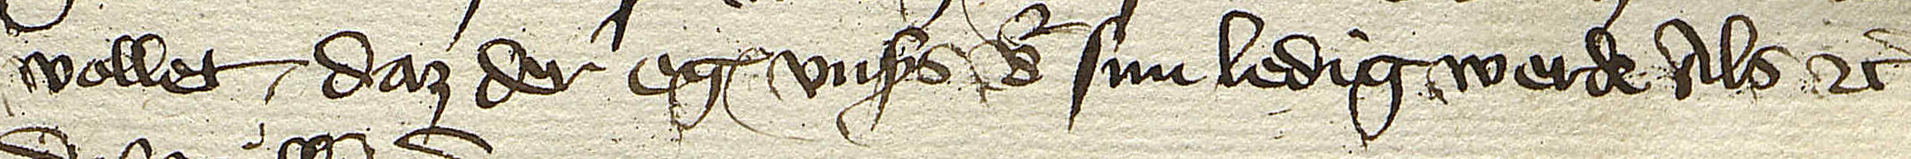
wollet / daʒ der eg* vnſ*s B* ſun ledig werde Als ec*
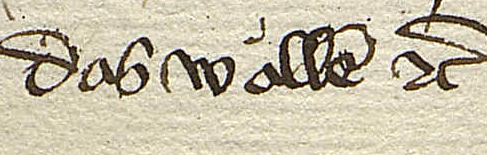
das wölle* ec*
